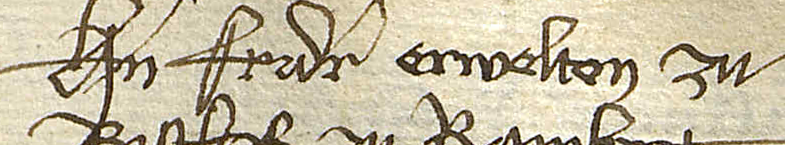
H*n Fridr* erwelten ʒu
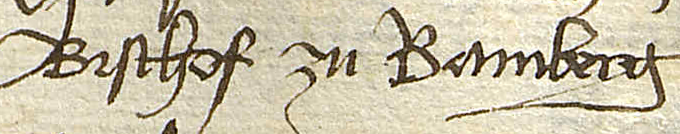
Biſchof ʒu Bamberg
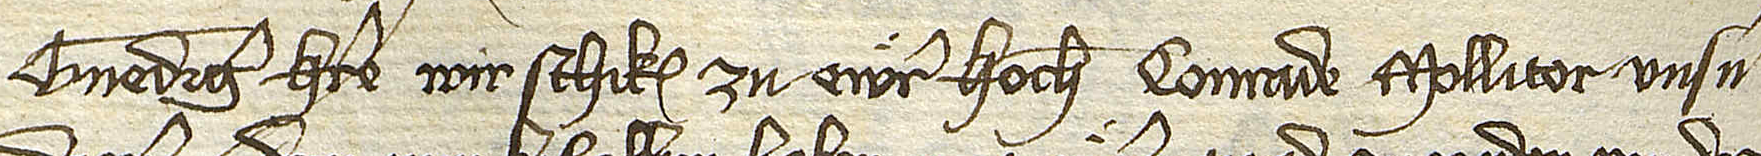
Gnedig* hre* wir ſchik* ʒu ewr* hoch* Conrade Mollitor vnſ*n
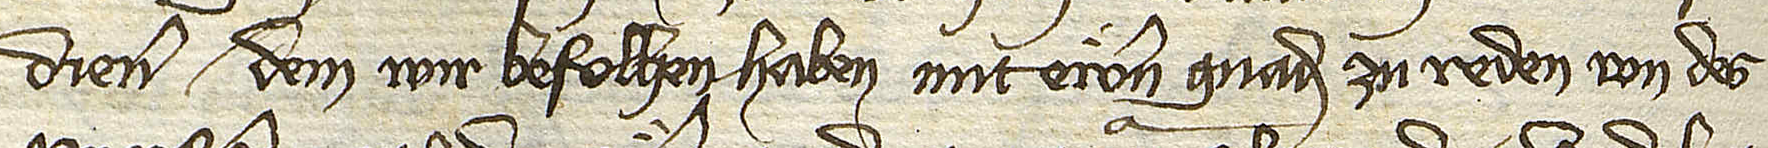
dien* / dem wir befolhen haben mit ew*n gnad* ʒu reden von des
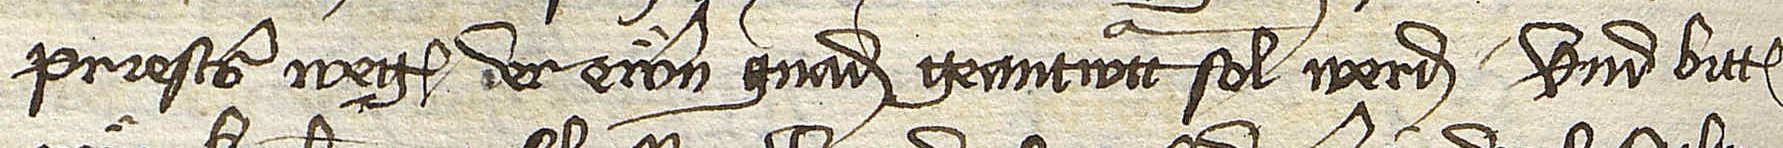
prieſt*s weg* der ew*n gnad* geantw*tt ſol werd* / Vnd bitt*
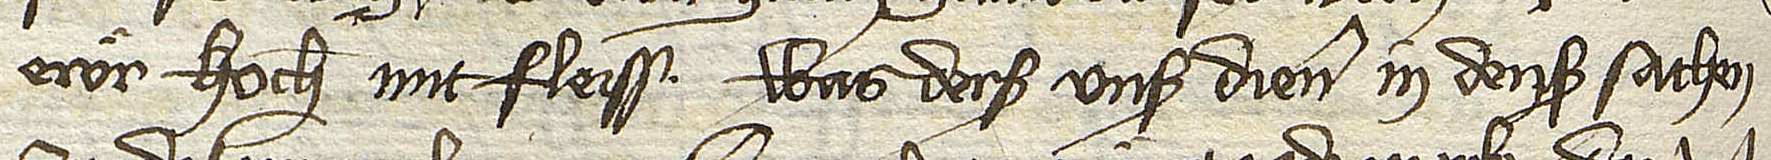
ewr hoch* mit fleiſſ . Was derſ* vnſ* dien* in denſ* ſachen
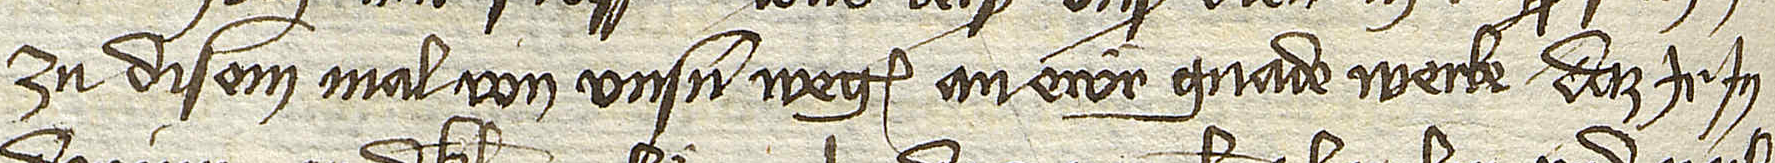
ʒu diſem mal von vnſ*n weg* an ewr gnade werbe / Daʒ Ir In
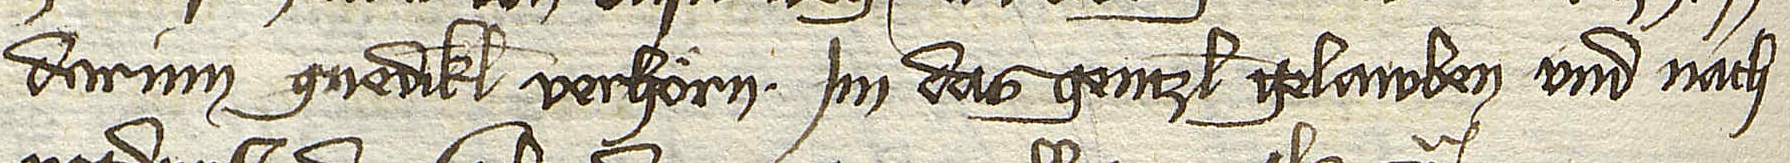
darinn gnedikl* verhörn . Im das gencʒl* gelawben vnd nach
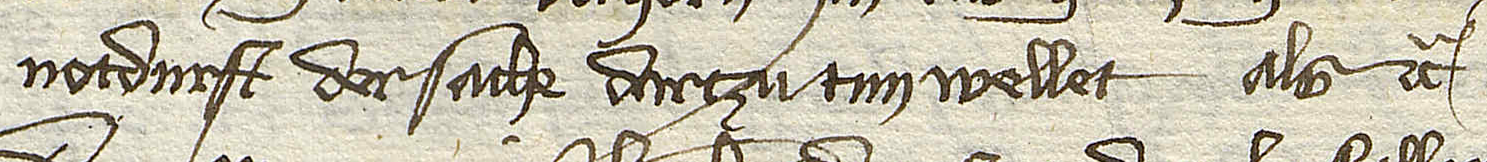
notdurft der ſache darcʒu tun wellet als ec*
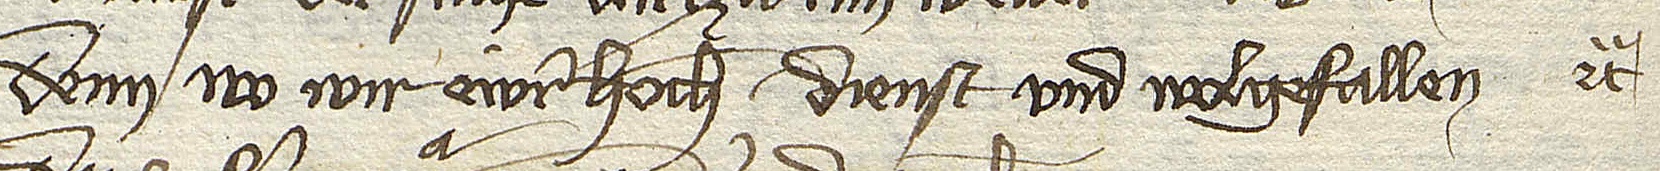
Denn wo wir ewr* hoch* / dienſt vnd wolgefallen ec*
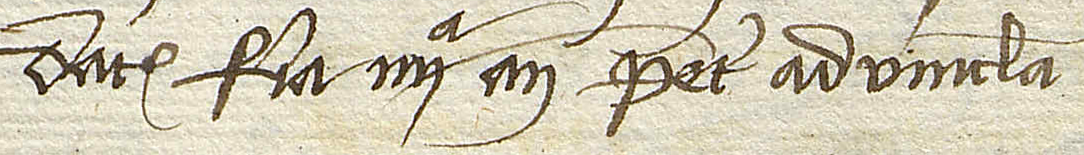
Dat* fia* iiii* an* Pet* ad vincla*
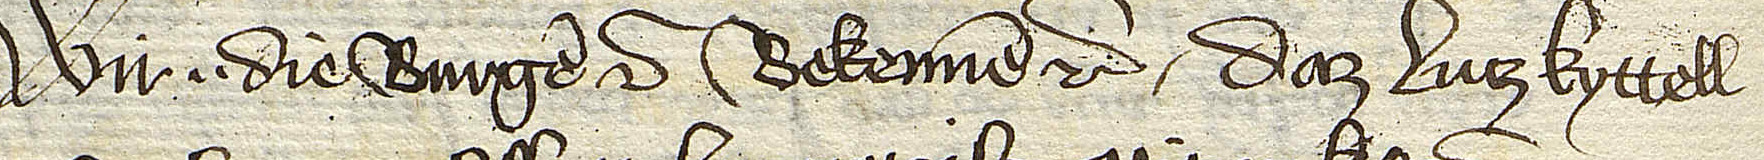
Wir ~ die Burge* ec* Bekenne* ec* / daʒ Lucʒ kyttell
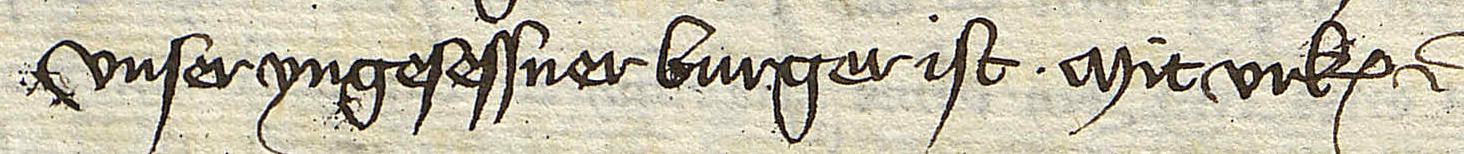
vnſer yngeſeſſner burger iſt . Mit vrk* ec*
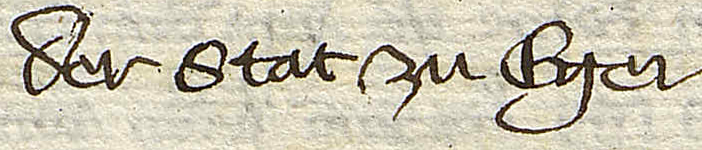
Der Stat cʒu Eger
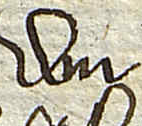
Wir
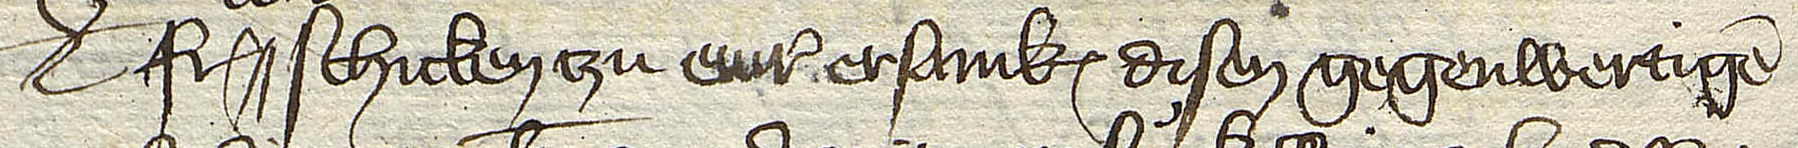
L* fr* ſchicken cʒu ewr* erſamk* diſen gegenwertige*
